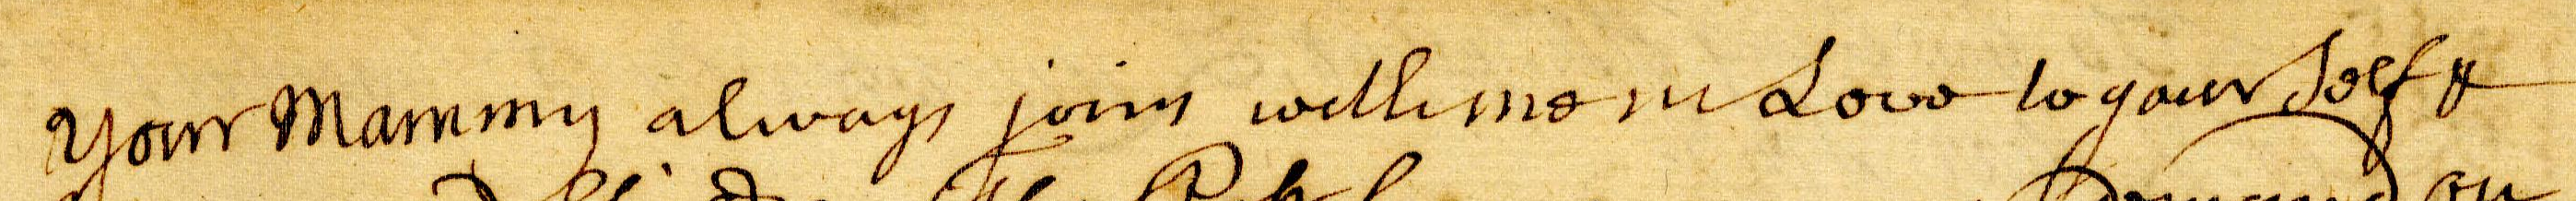Your Mammy always joins with me in Love to your self &
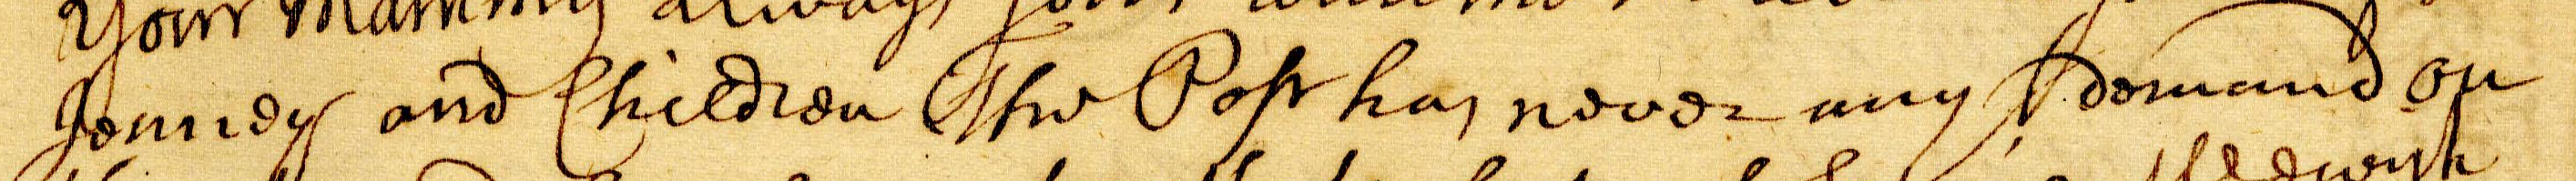Jonney and Children the Pop has never any demand of
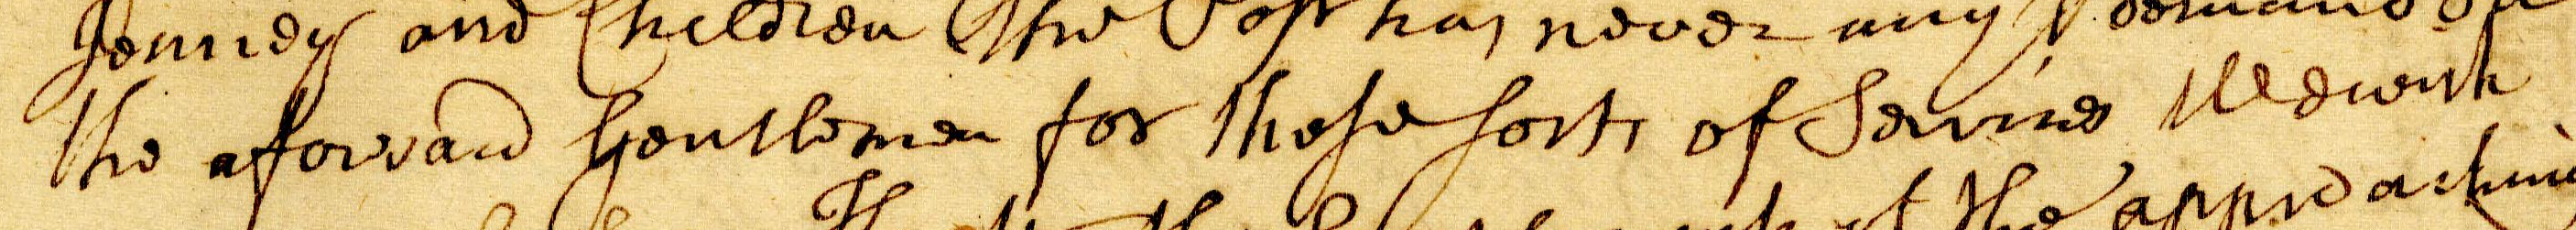the aforesaid Gentlemen for these sorts of services We wish
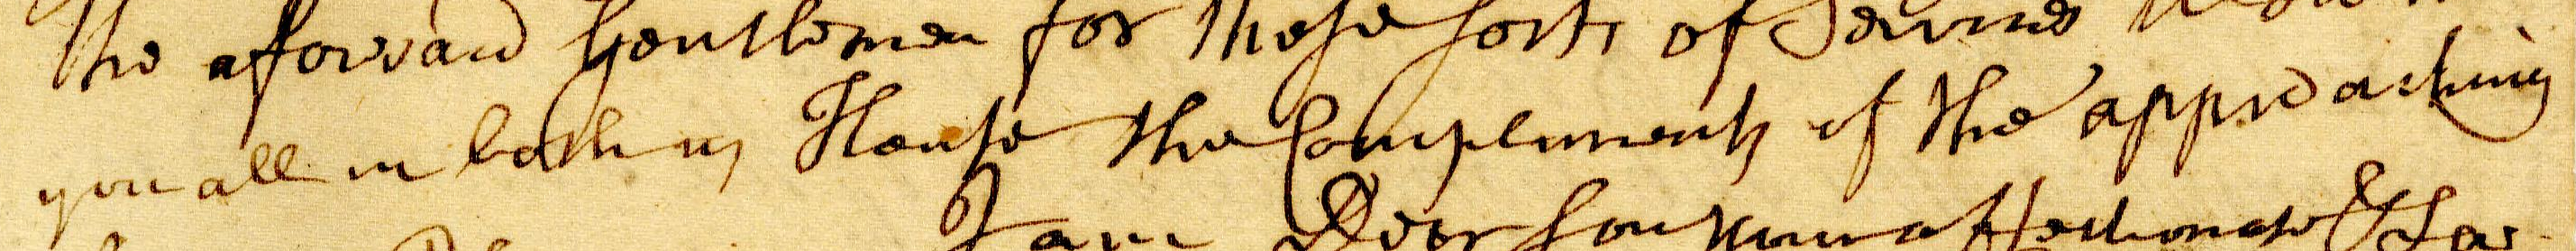you all in both my House the Complements of the approaching
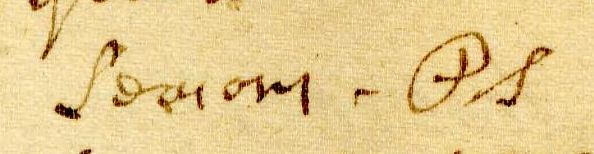Season- PS
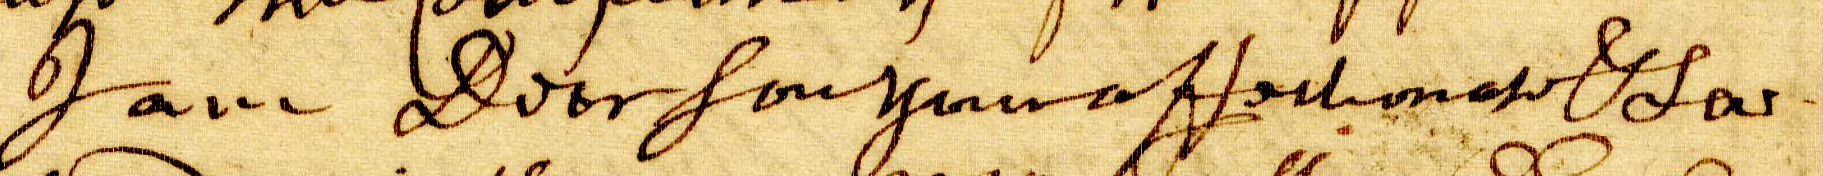I am Dear son Your Affectionate & Lov-
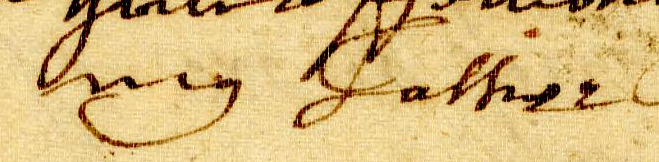ving Father
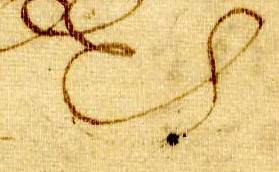ES
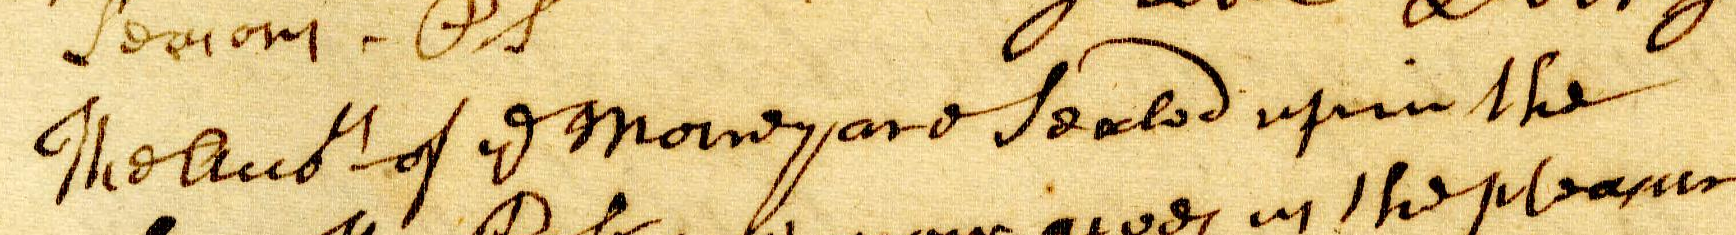The Acco^ts of y^e Money and Sealed upin the
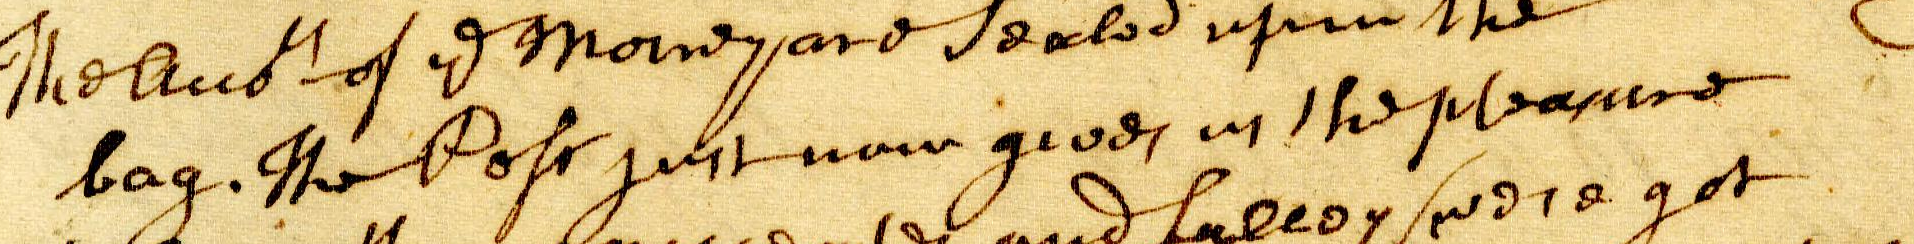bag. He Poss just now gives us the pleasure
